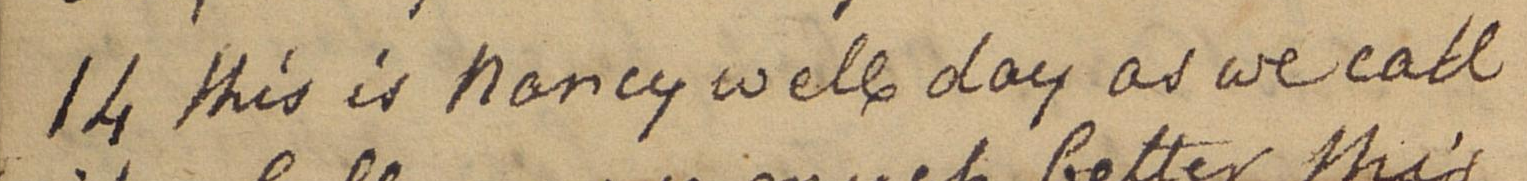14 this is Nancy well day as we call
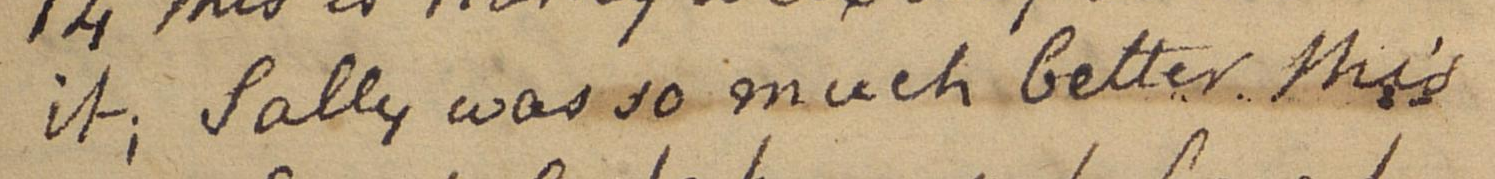it; Sally was so much better this
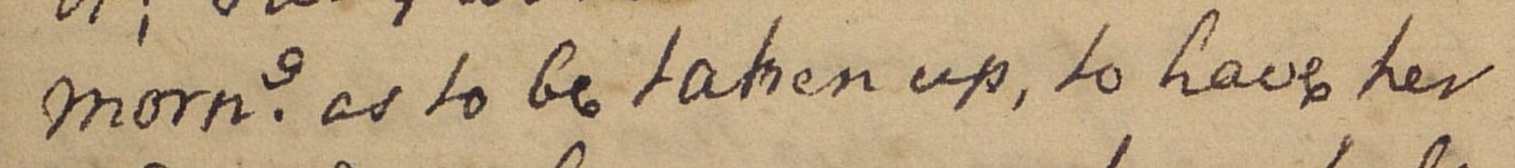morn^g. as to be taken up, to have her
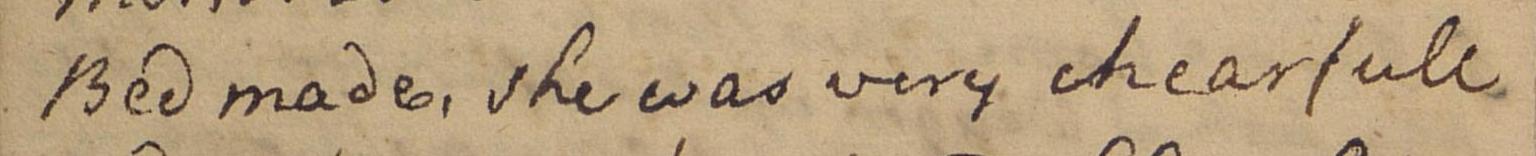Bed made, she was very chearfull
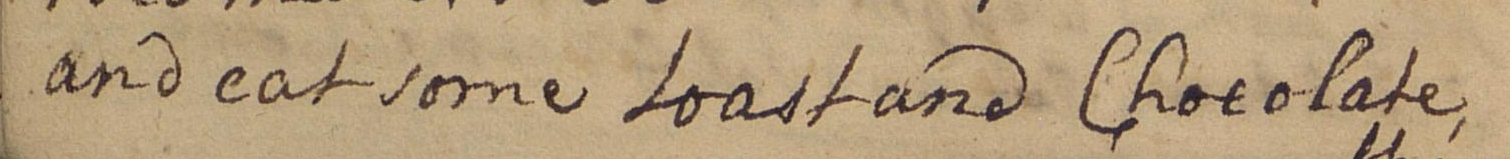and eat some toast and Chocolate,
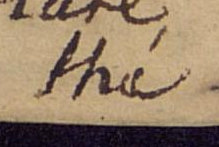thee
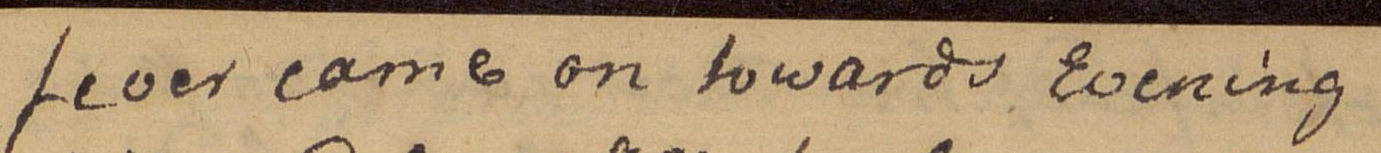fever came on towards Evening
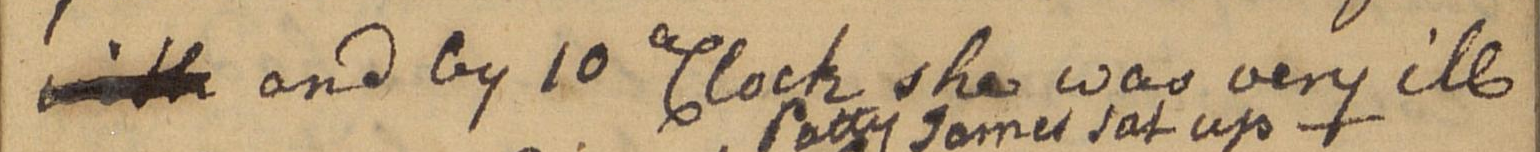[with] and by 10 ^o Clock she was very ill
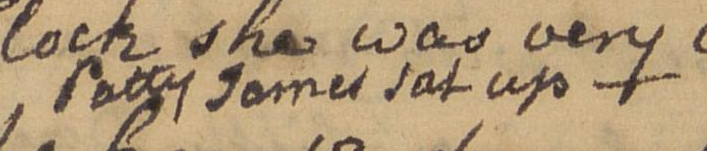Patty James sat up -
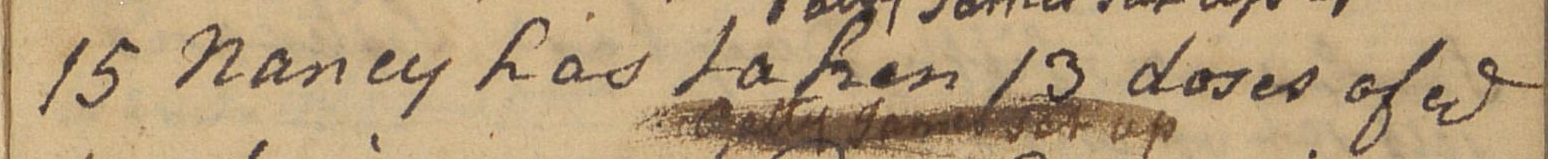15 Nancy has taken 13 doses of y^e
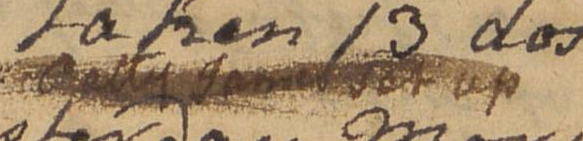[Patty James set up]
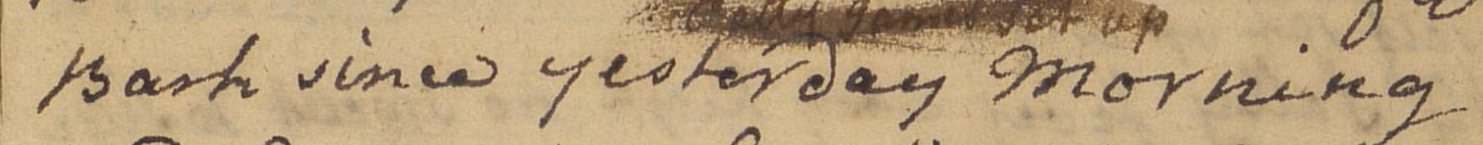Bark since yesterday Morning
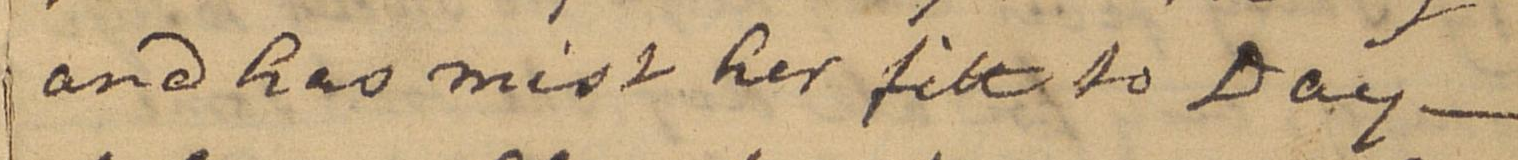and has mist her fitt to Day-
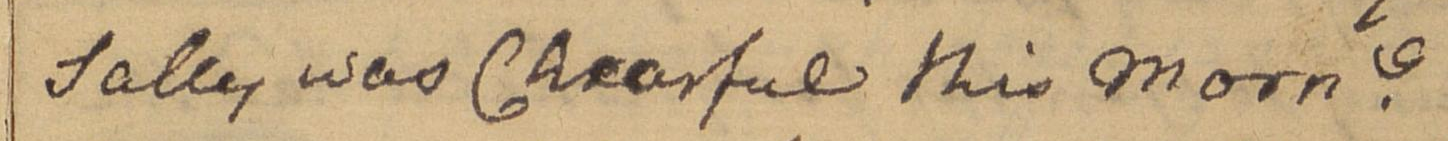Sally was Chearful this Morn^g.
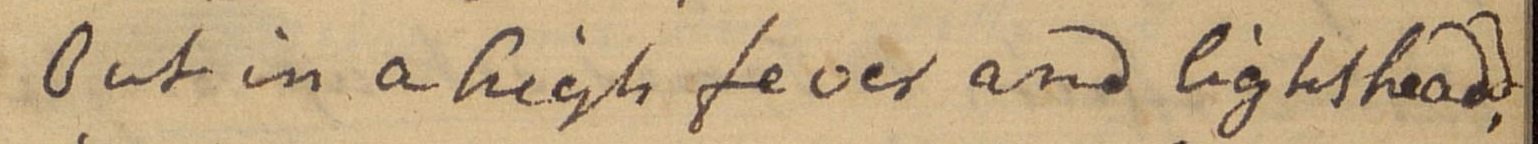But in a high fever and lightheadd,
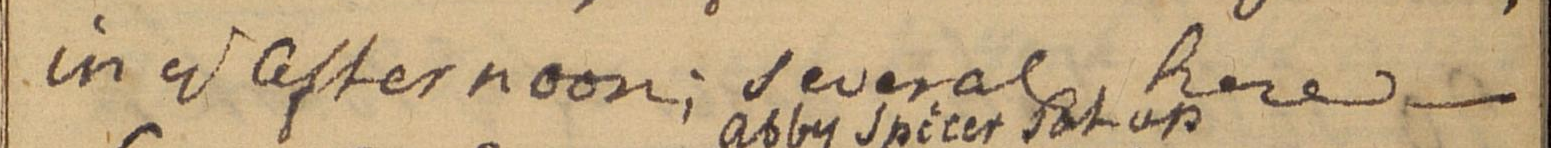in y^e afternoon; several, here-
